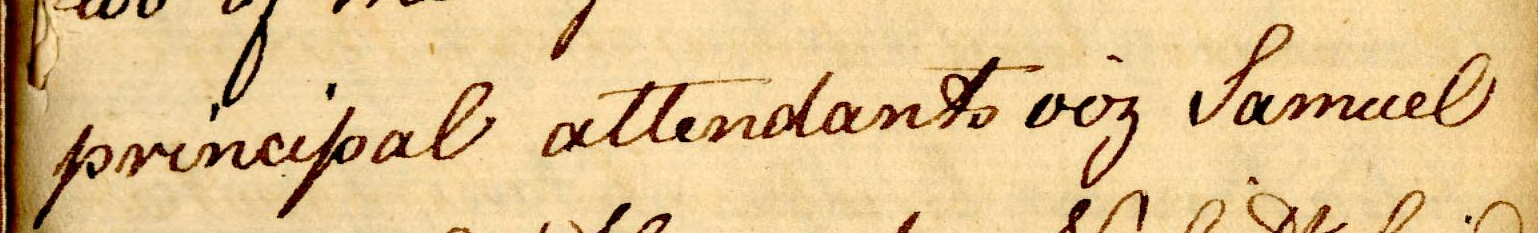principal attendants viz Samuel
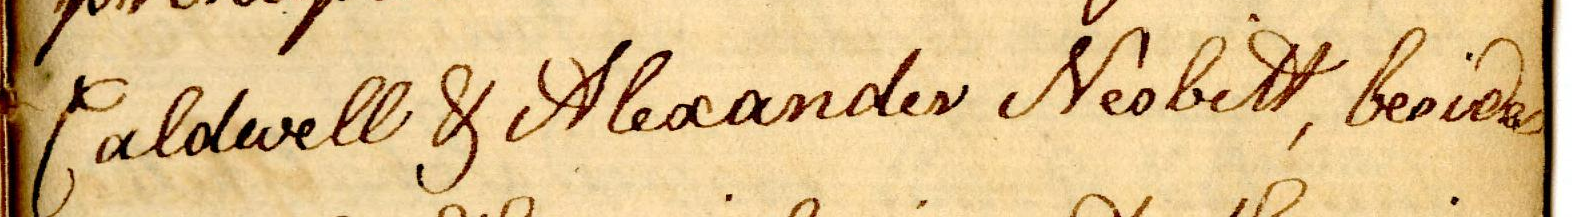Caldwell & Alexander Nesbitt, beside
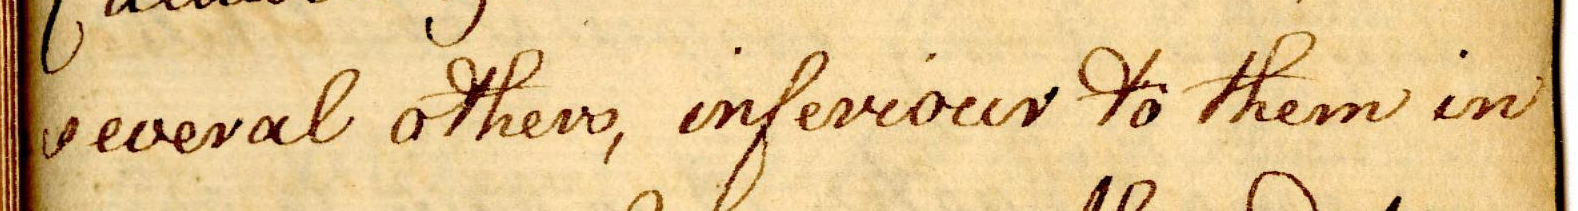several others, inferiour to them in
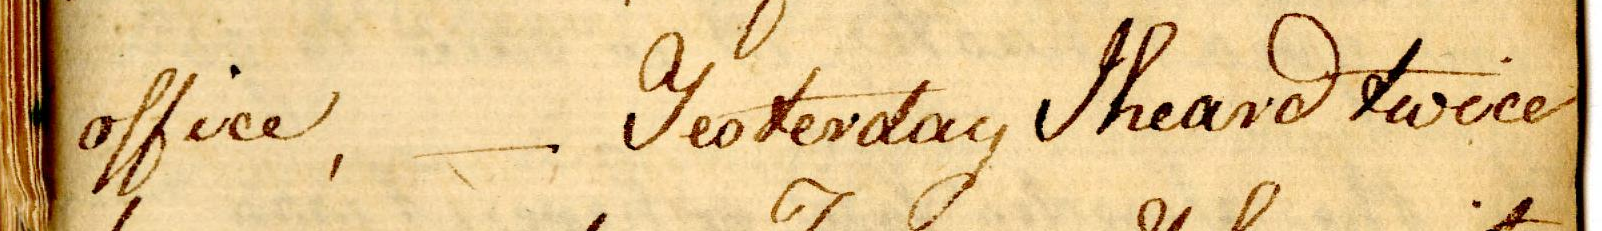office,- Yesterday, I heard twice
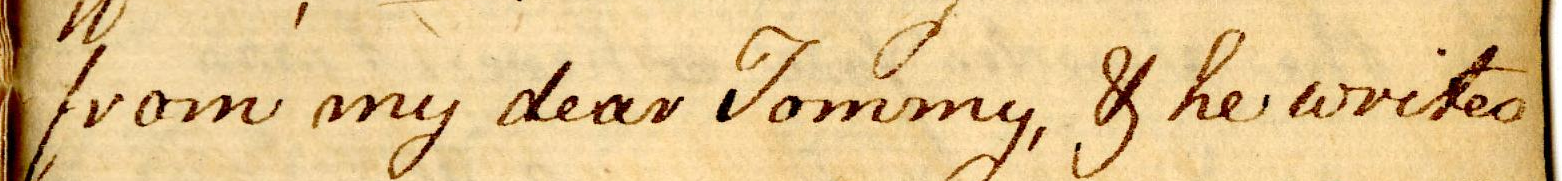from my dear Tommy, & he writes
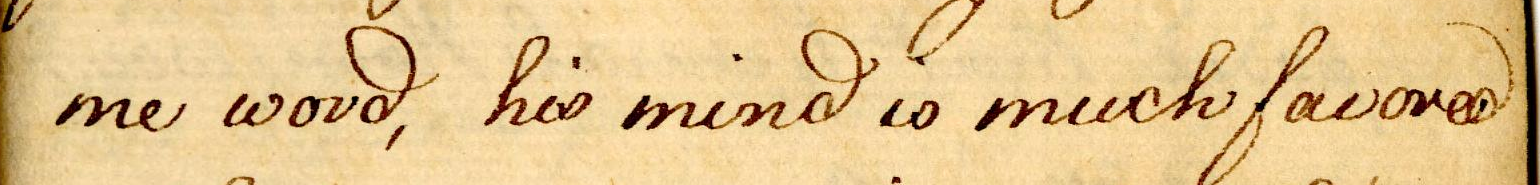me word, his mind is much favored
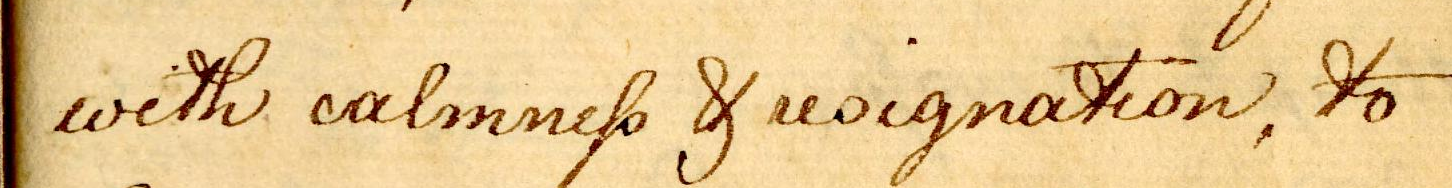with calmness & resignation, to
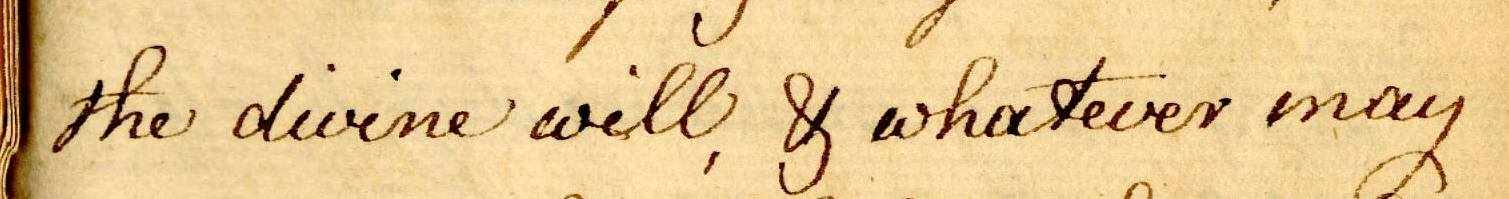the divine will, & whatever may
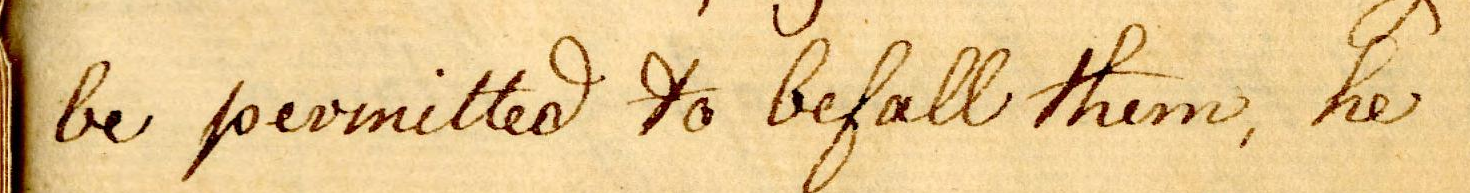be permitted to befall them, he
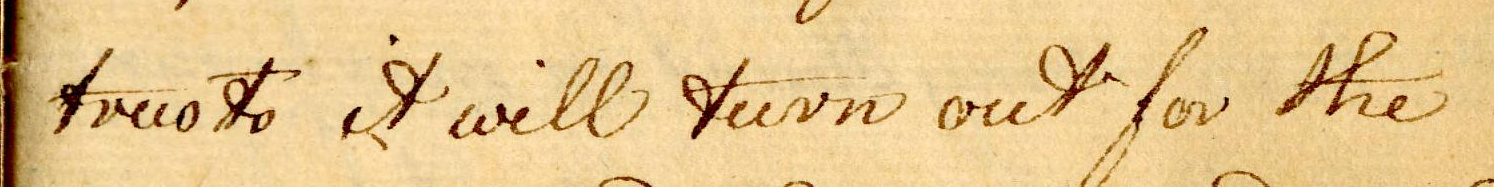trusts it will turn out for the
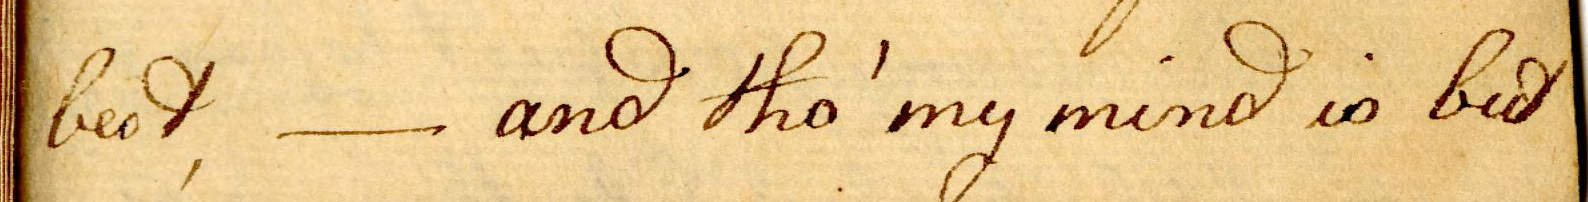best,- and tho' my mind is but
